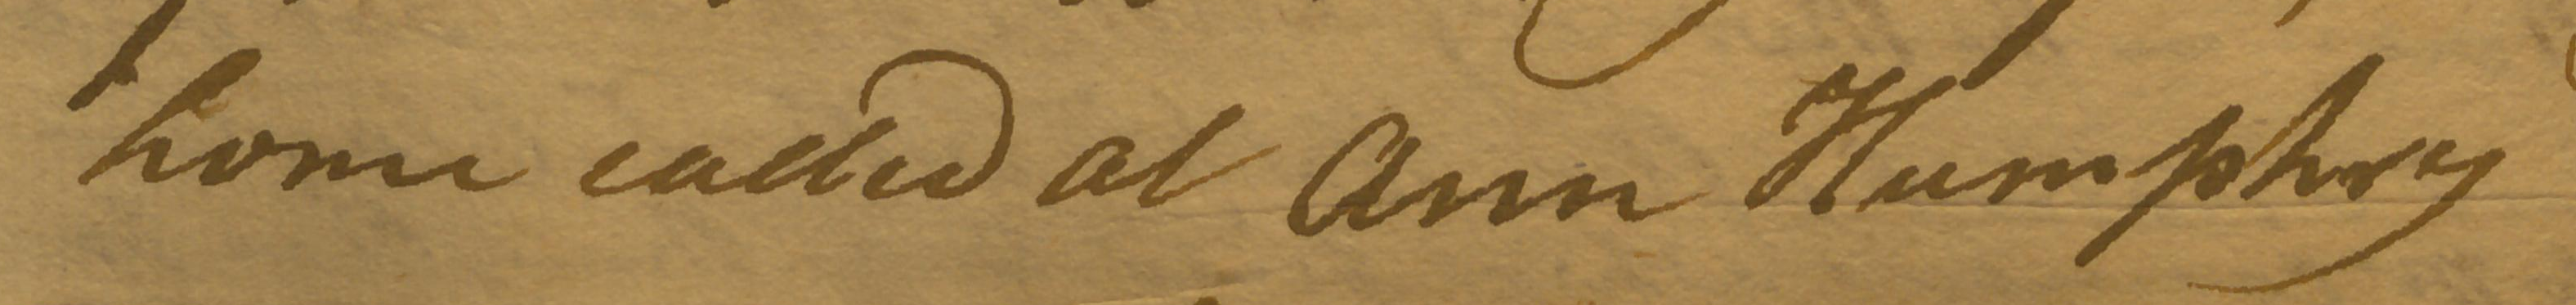home called at Ann Humphry
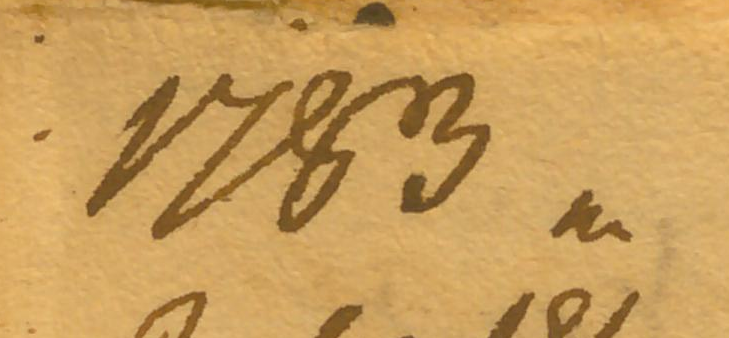1783
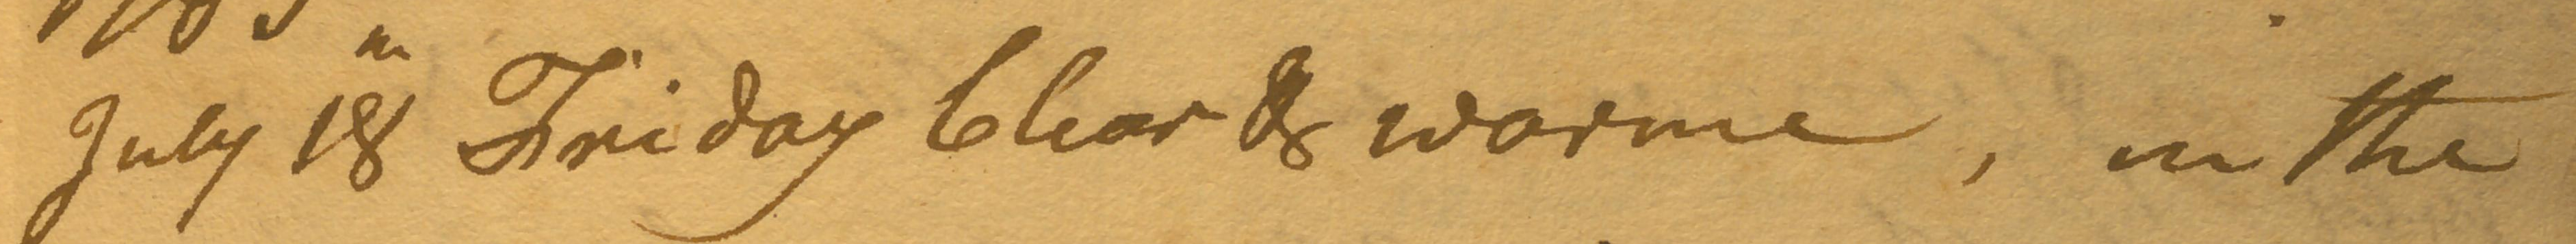July 18^th Friday Clear & warme, in the
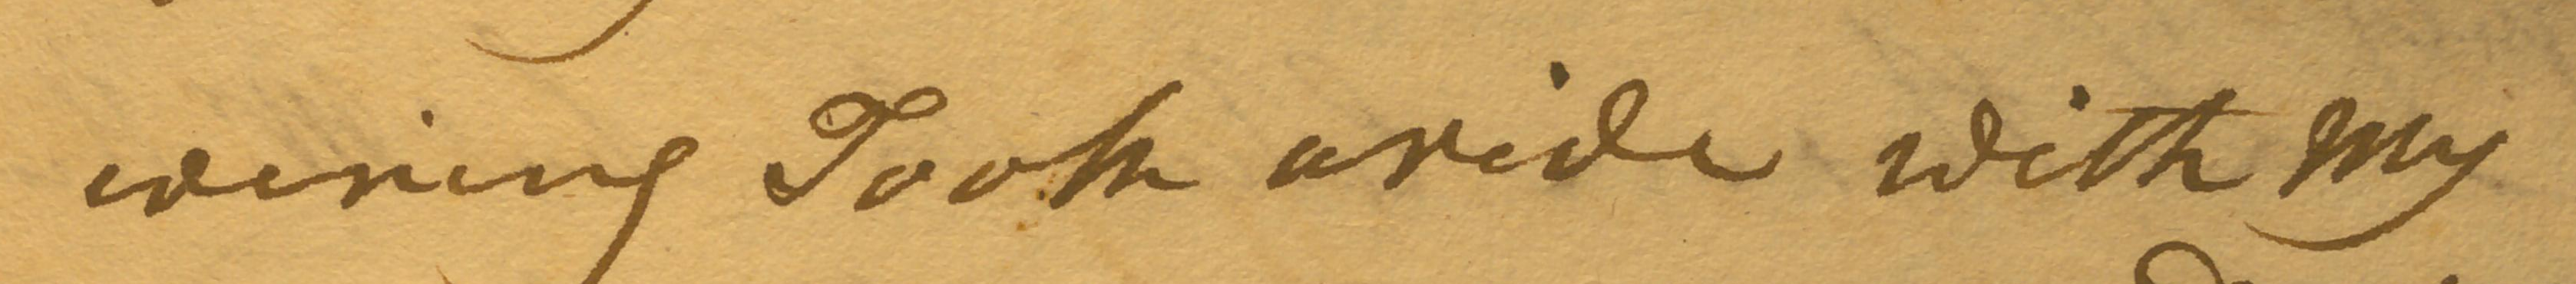evening Took a ride with My
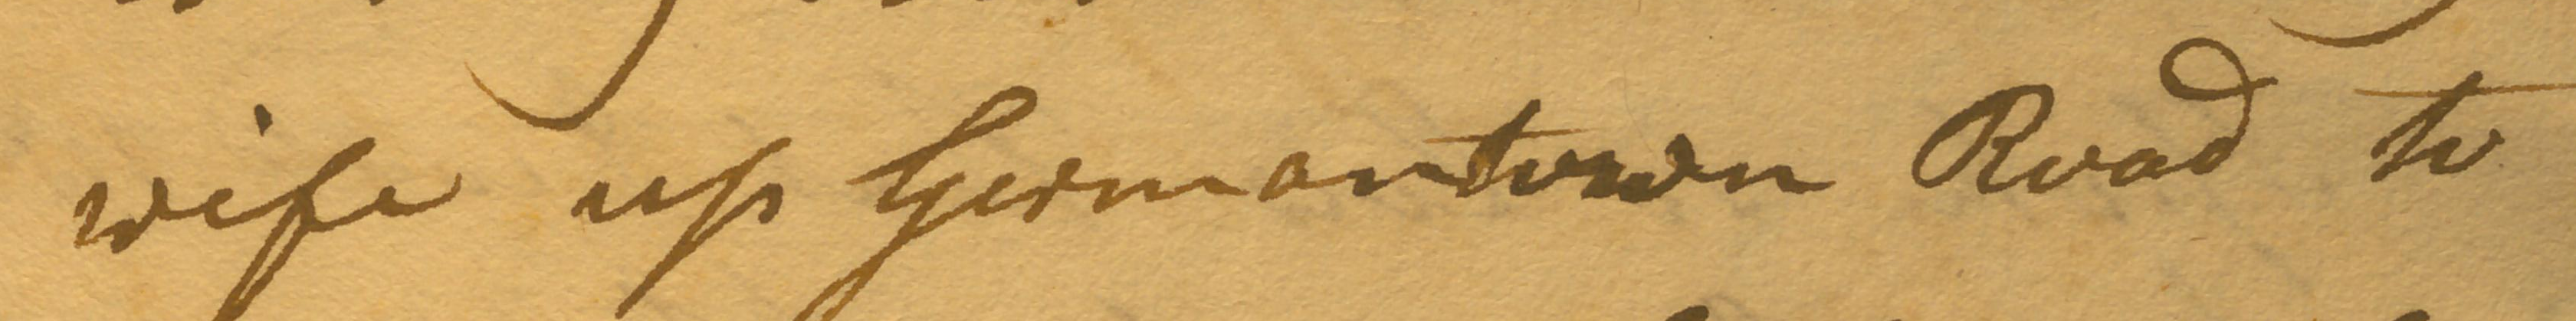wife up Germantown Road to
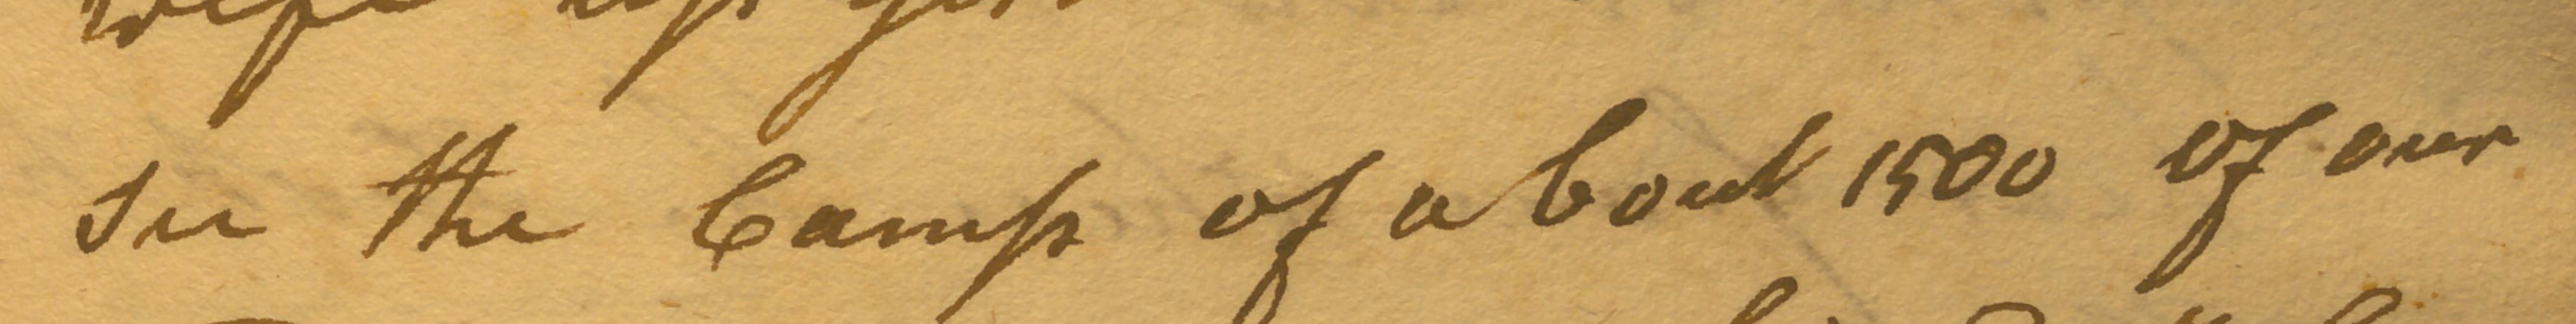see the Camp of about 1500 of our
